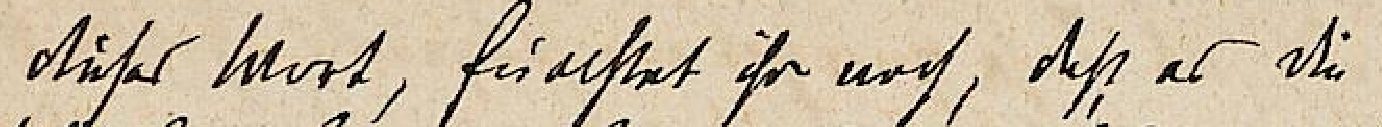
dieses Wort, fürchtet ihr noch, daß es die
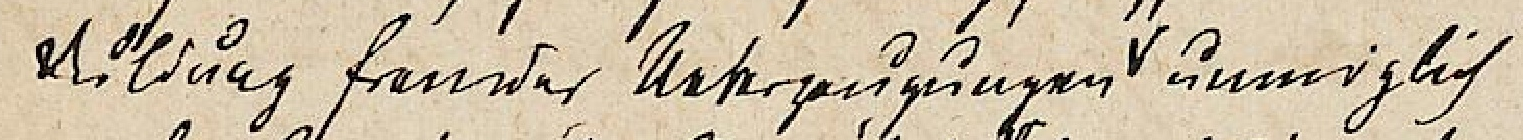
Duldung fremder Ueberzeugungen V unmöglich
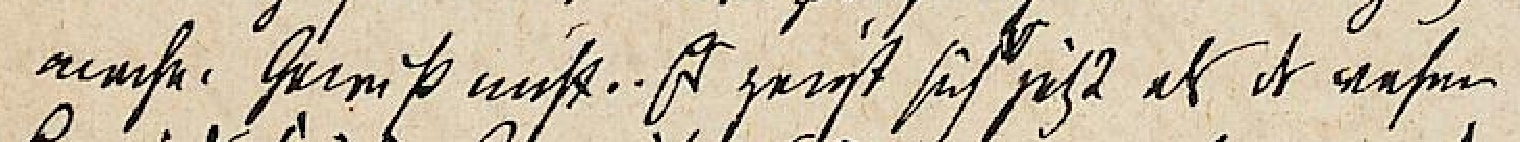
mache. Gewiß nicht. Es zeigt sich jetzt als ds wahre
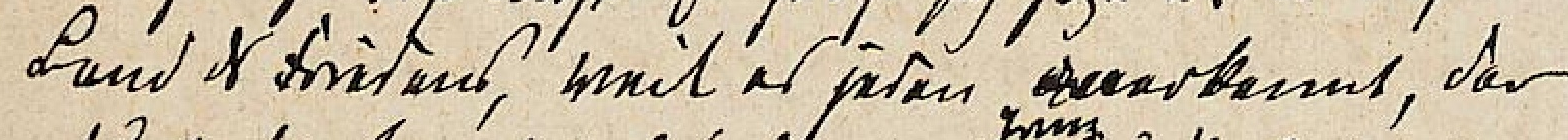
Band ds Friedens, weil es jeden anerkennt, der
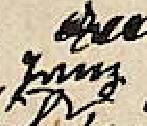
ganz
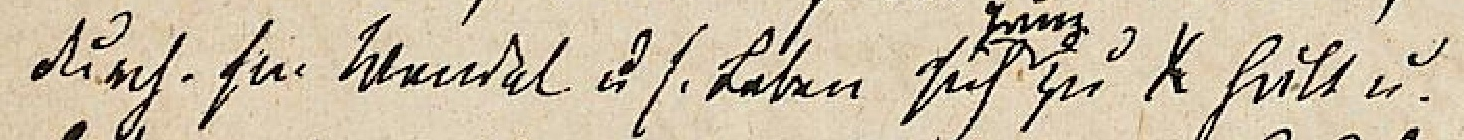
durch. sn. Wandel u. s. Leben sich zu Χ hält u.
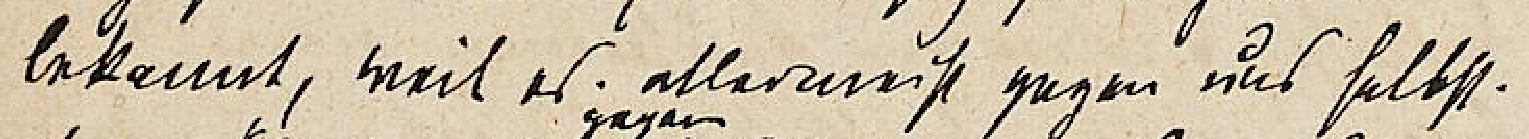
bekennt, weil es. allermeist gegen uns selbst.
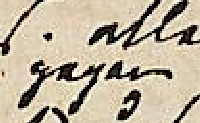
gegen
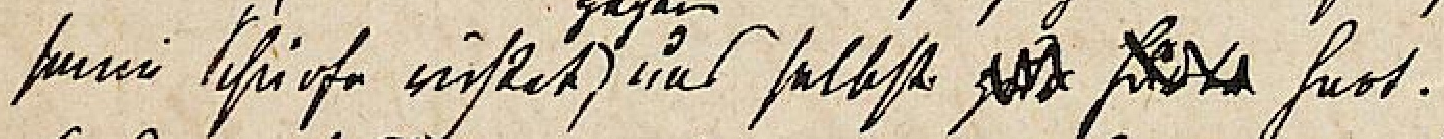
seine Schärfe richtet, uns selbst zur Härte hart.
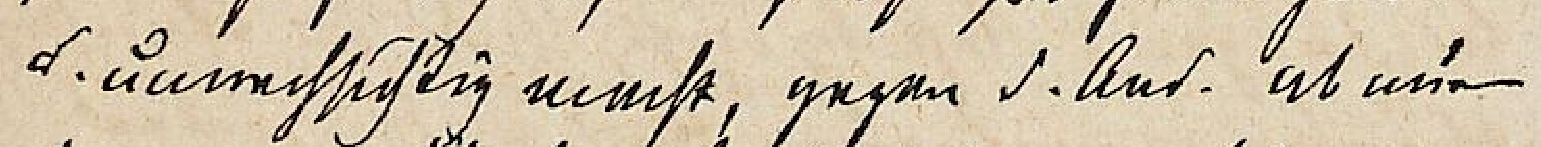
u. unnachsichtig macht, gegen d. And. ab. nur
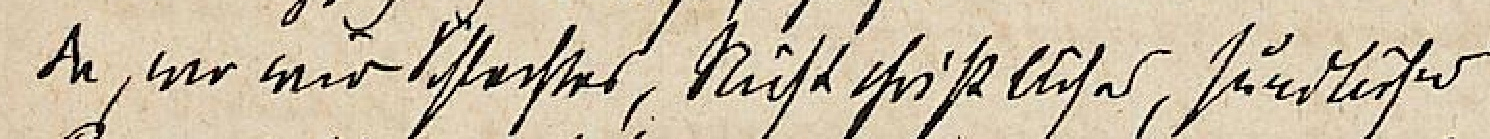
da, wo wir Schlechtes, Nichtchristliches, sündliches
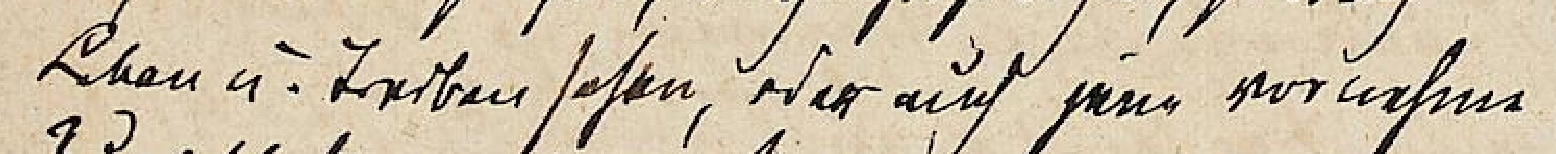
Leben u. Treiben sehen, oder auch jene vornehme
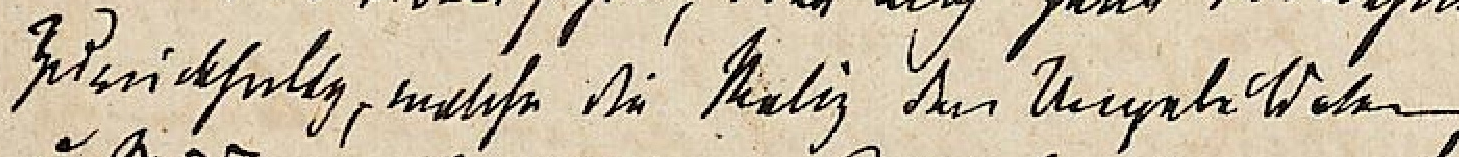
Zurückhaltg, welche die Relig. den Ungebildenten
